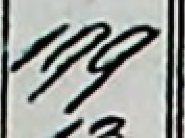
199
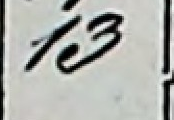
13
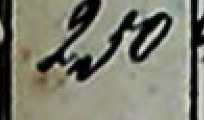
250
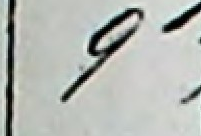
9
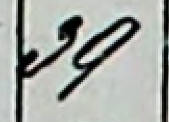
39
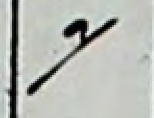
7
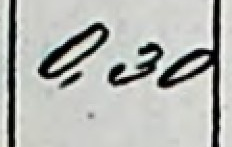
0,30
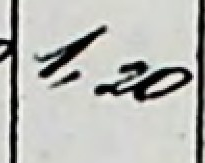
1,20
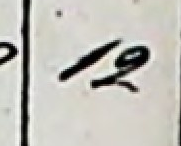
12
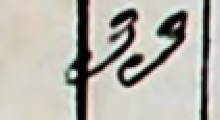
33
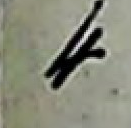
4
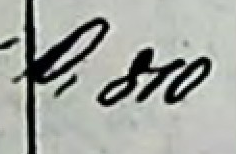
0,810
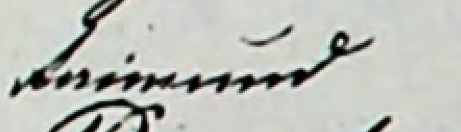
Raimund
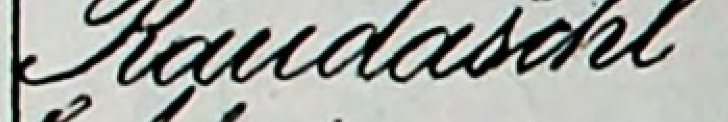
Raudaschl
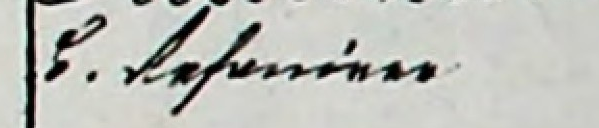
v. Refaniner
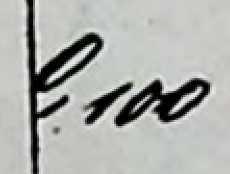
0,100
